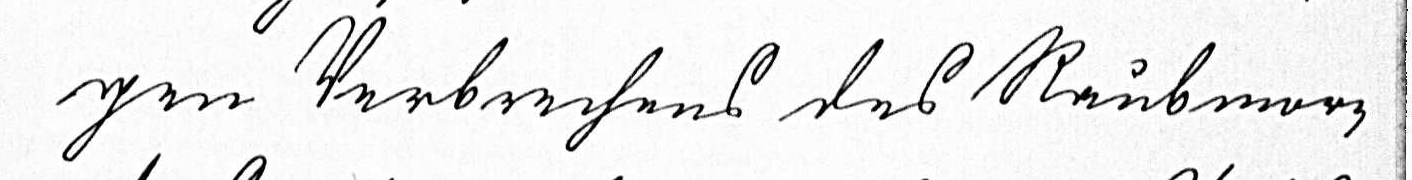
gen Verbrechens des Raubmor¬
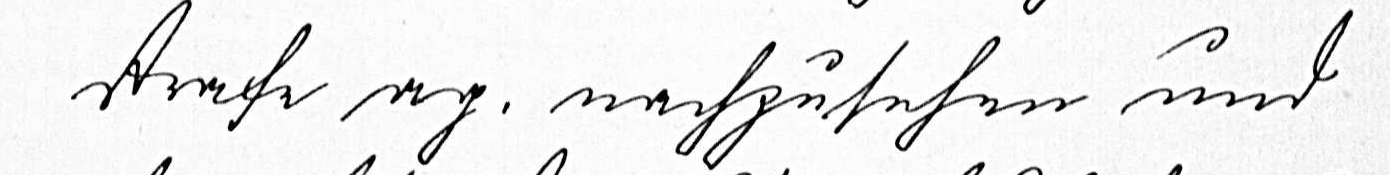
strafe ag. Nachzusehen und
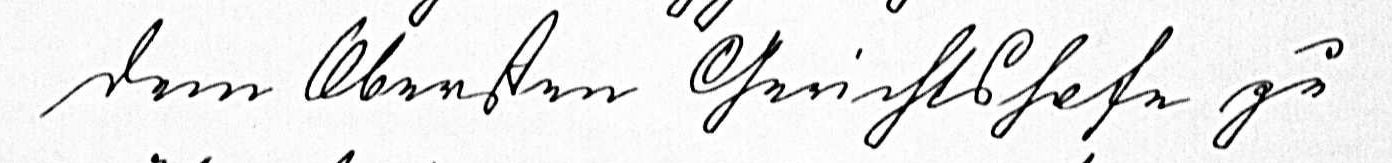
dem obersten Gerichsthofe zu
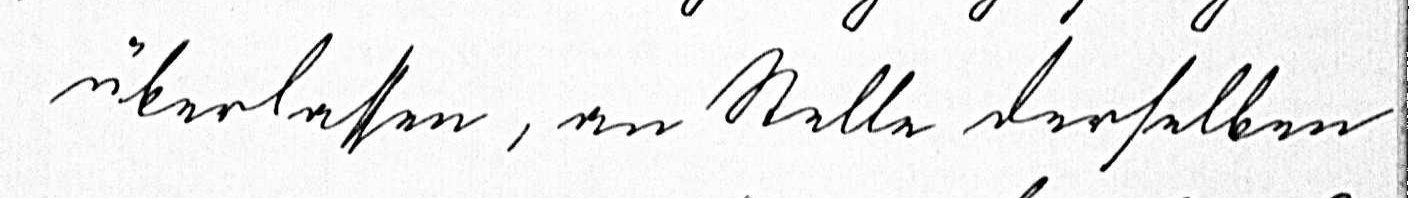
überlassen, an Stelle derselben
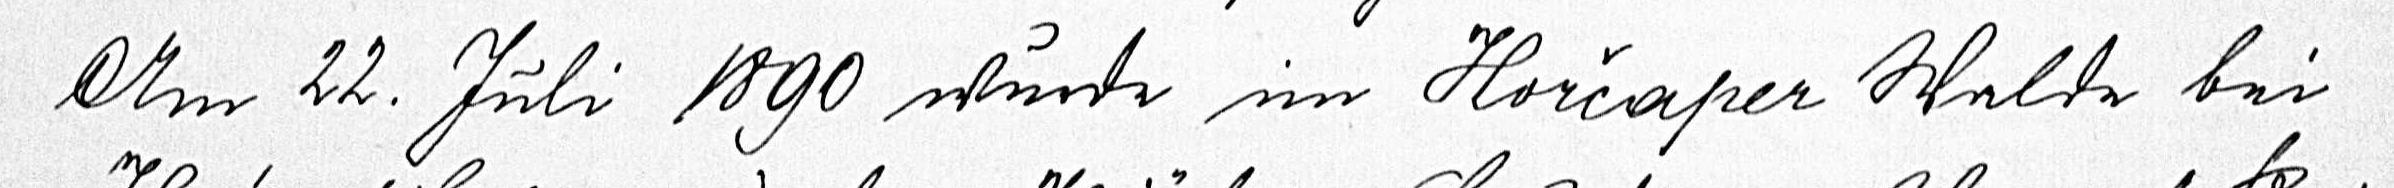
Am 22. Juli 1890 wurde in Horčaper Walde bei
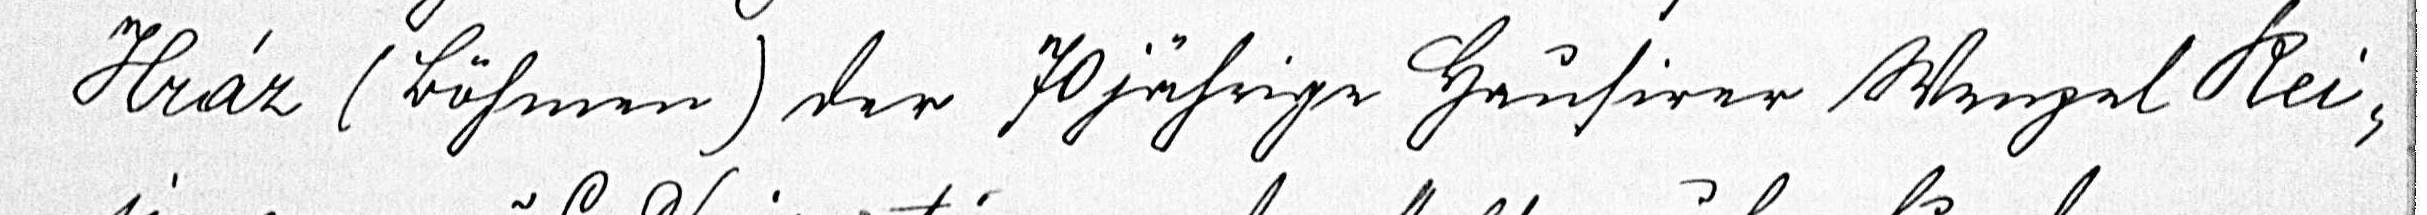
Hráz (Böhmen) der 70jährige Hausirer Wenzel Rei¬
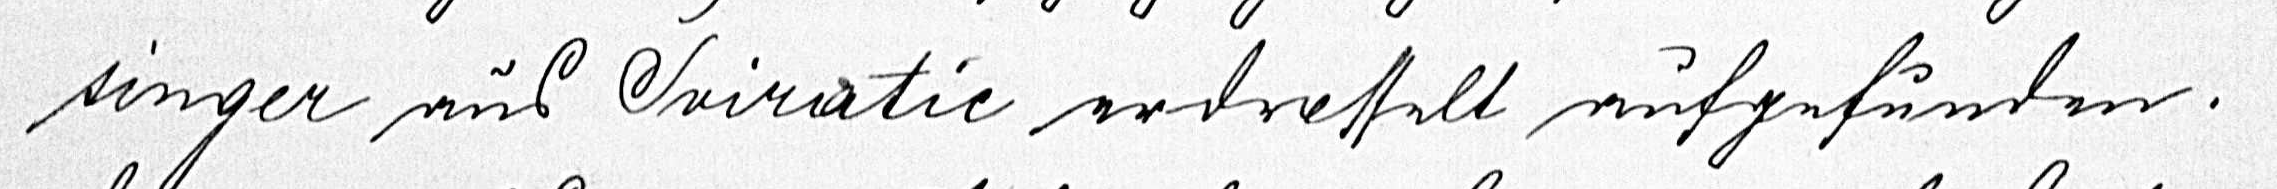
singer aus Sviratic erdrosselt aufgefunden.
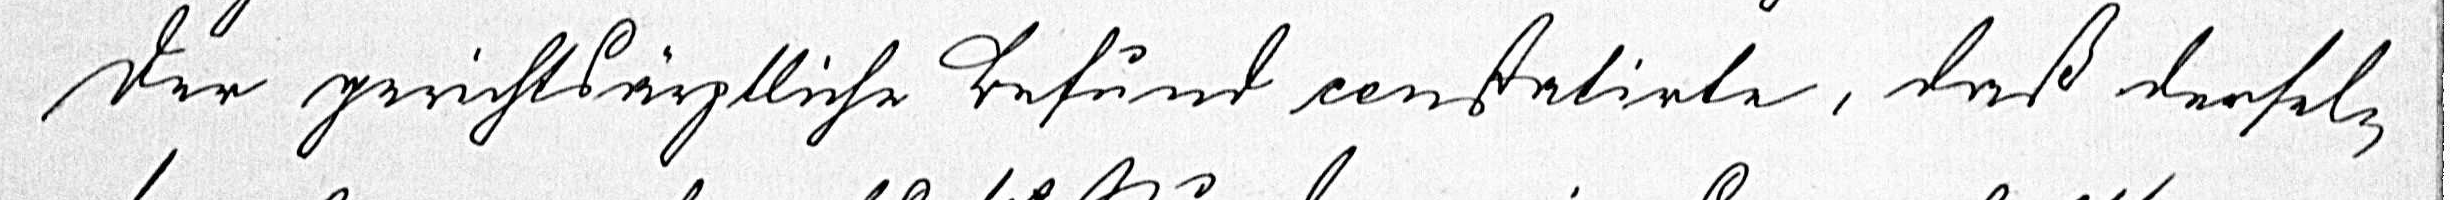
Der gerichtsärztliche Befund constatirte, daß dersel¬
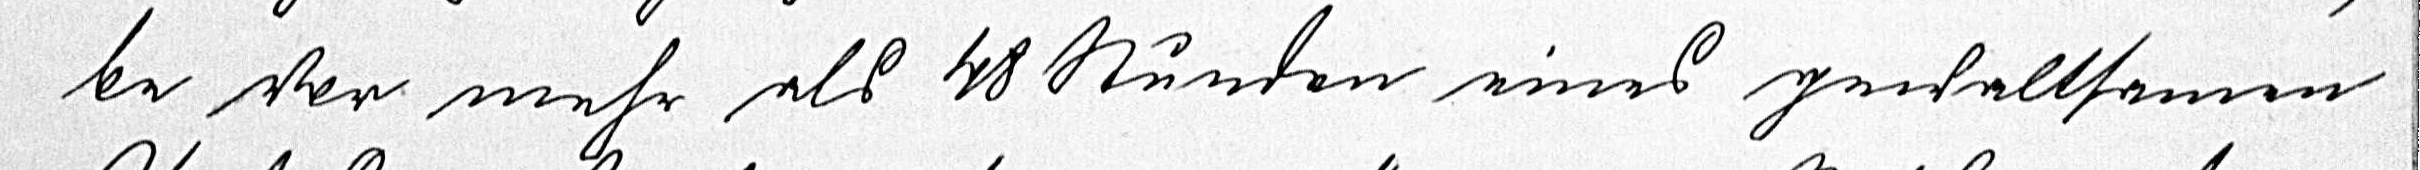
be vor mehr als 48 Stunden eines gewaltsamen
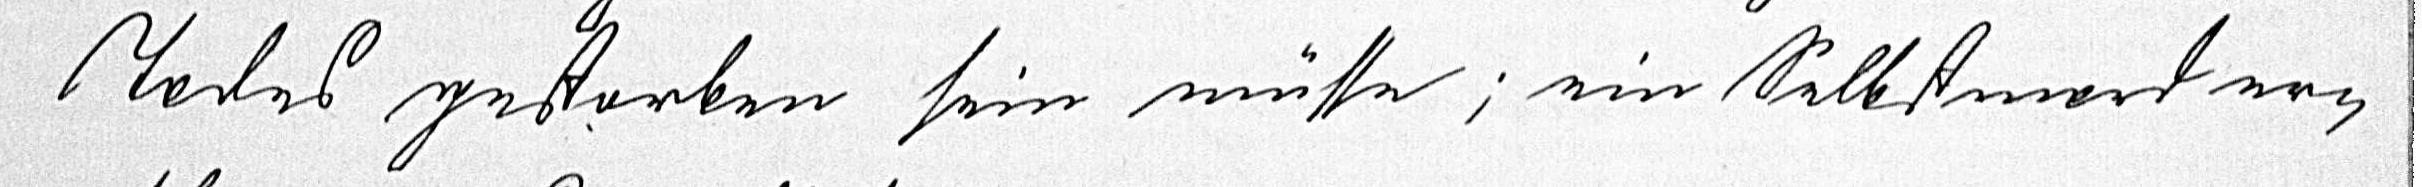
Todes gestorben sein müsse; ein Selbstmord er¬
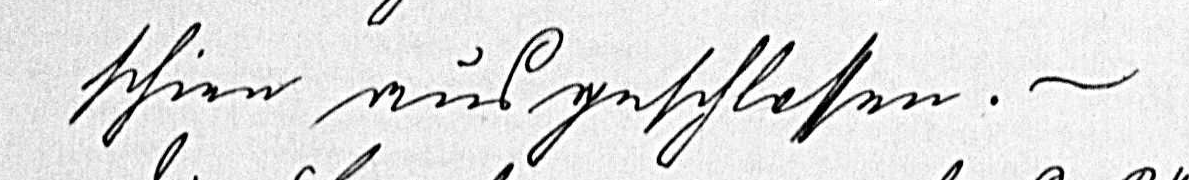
schien ausgeschlossen.
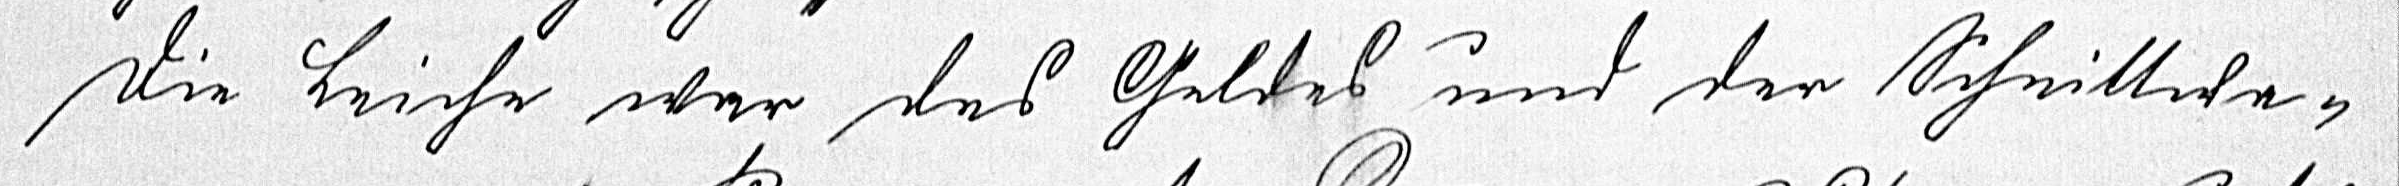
Die Leiche war des Geldes und der Schnittwa¬
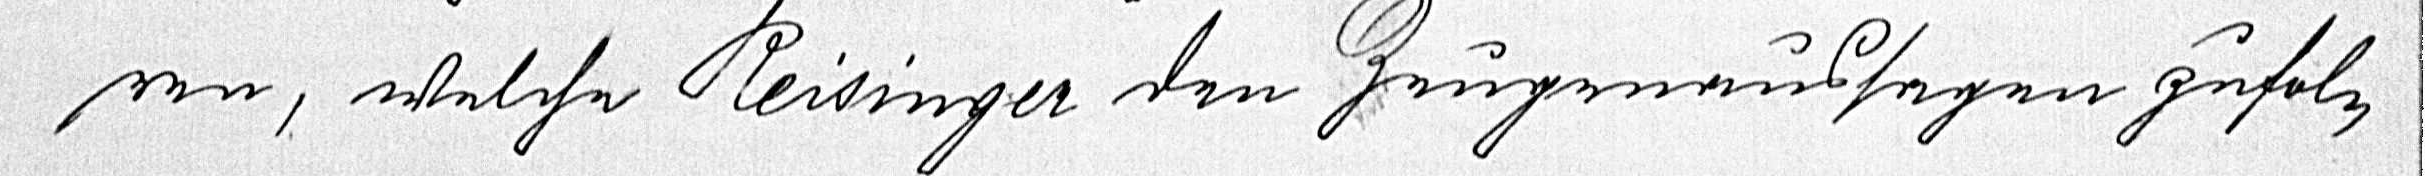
ren, welche Reisinger den Zeugenaussagen zufol¬
